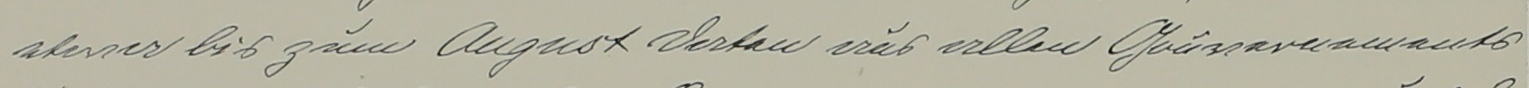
etwa bis zum August Daten aus allen Gouvernements
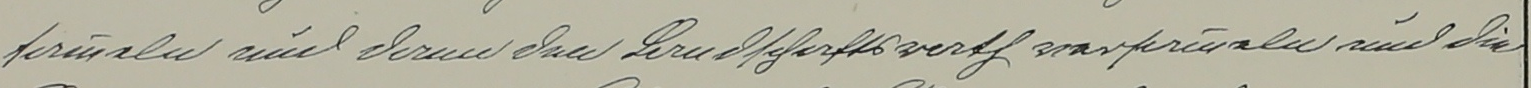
sammeln und dann den Landschaftsrath versammeln und die
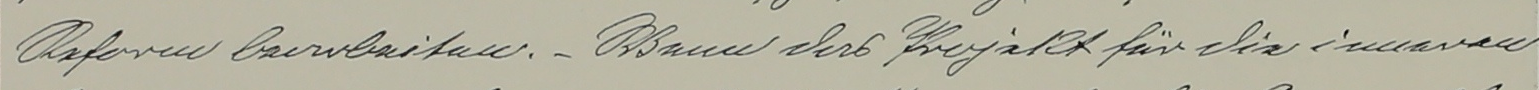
Reform bearbeiten. – Wenn das Projekt für die inneren
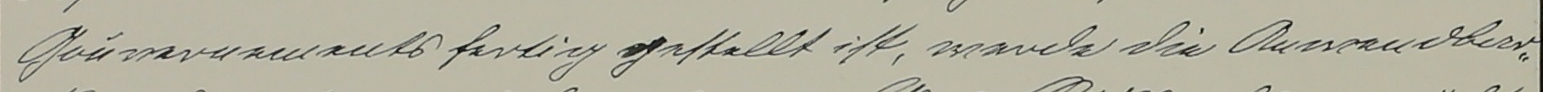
Gouvernements fertiggestellt ist, werde die Anwendbar-
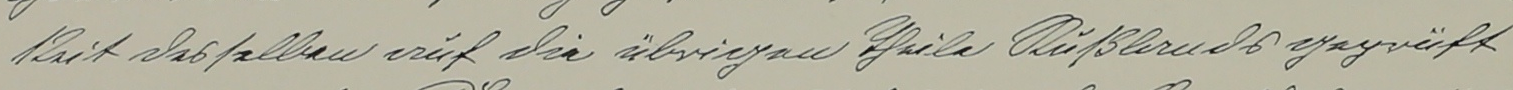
keit desselben auf die übrigen Theile Rußlands geprüft
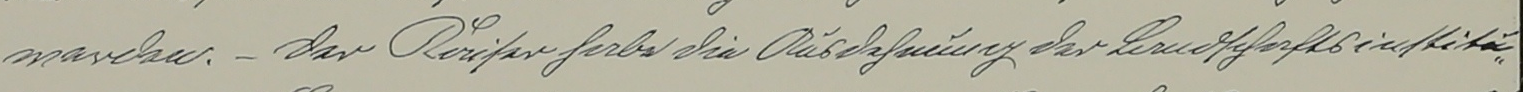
werden. - Der Kaiser habe die Ausdehnung der Landschaftsinstitu-
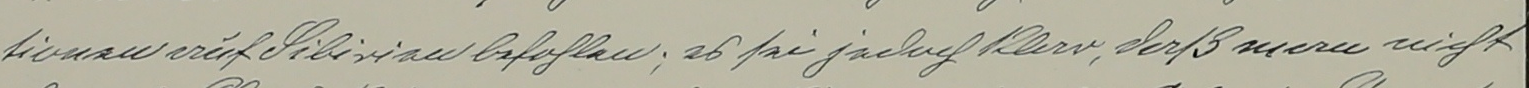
tionen auf Sibirien befohlen; es sei jedoch klar, daß man nicht
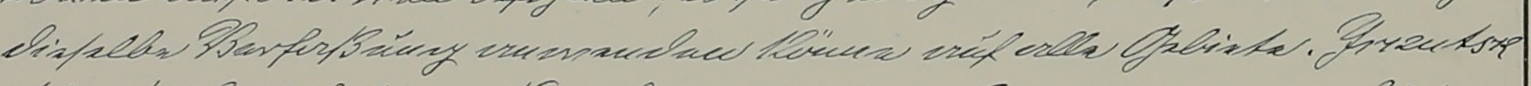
dieselbe Verfaßung anwenden könne auf alle Gebiete. Irkutsk
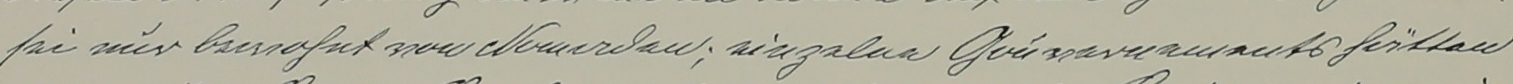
sei nur bewohnt von Nomaden; einzelne Gouvernements hätten
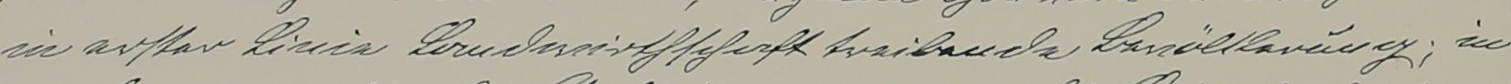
in erster Linie Landwirthschaft treibende Bevölkerung; in
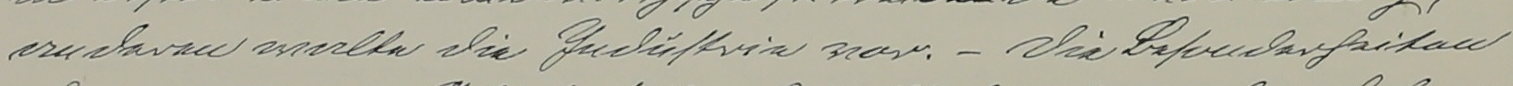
anderen walte die Industrie vor. - Die Besonderheiten
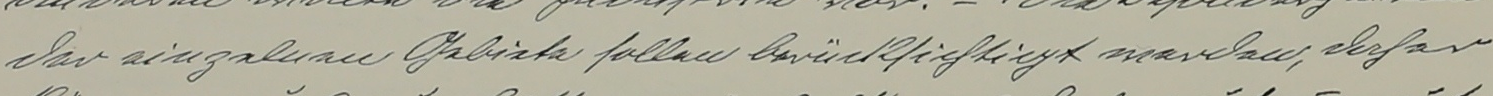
der einzelnen Gebiete sollen berücksichtigt werden, daher
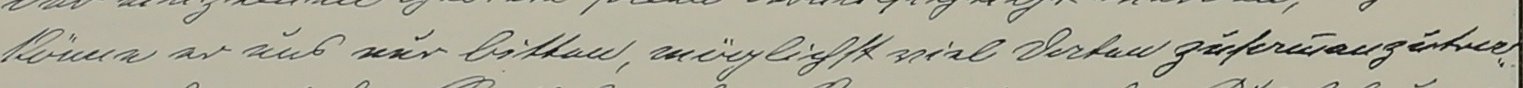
könne er uns nur bitten, möglichst viele Daten zusammenzutra-
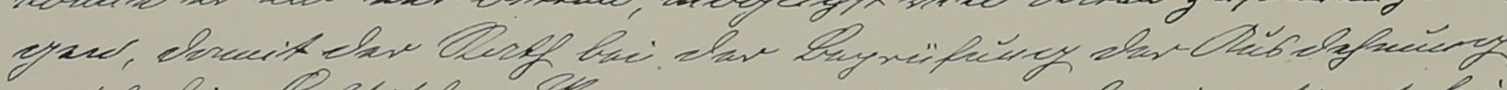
gen, damit der Rath bei der Beprüfung der Ausdehnung
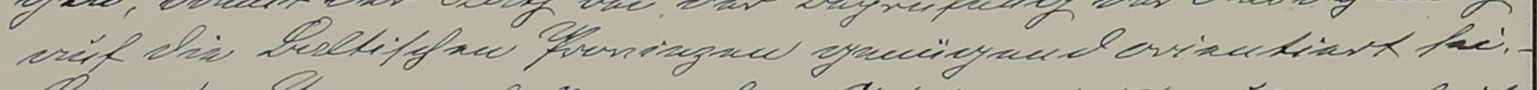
auf die Baltischen Provinzen genügend orientiert sei.
